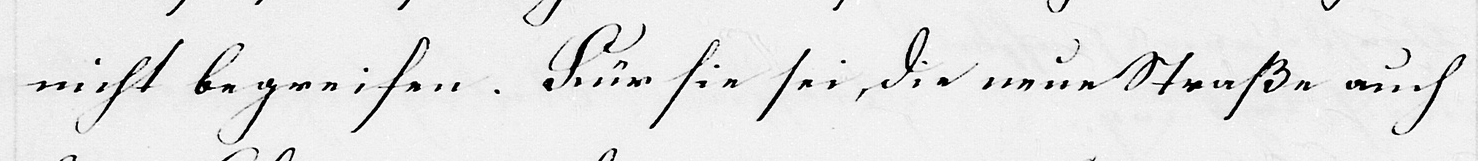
nicht begreifen. Für sie sei, die neue Straße auch
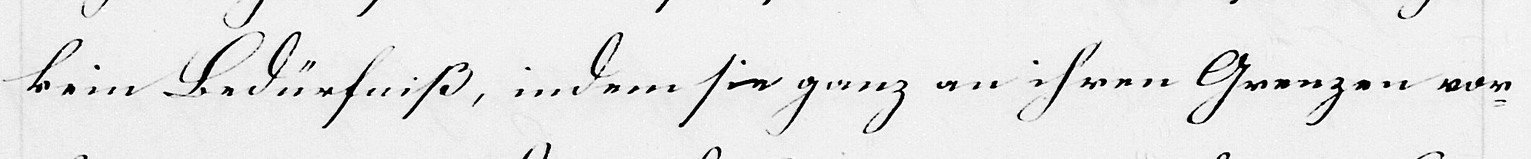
kein Bedürfniß, indem sie ganz an ihren Grenzen vor¬
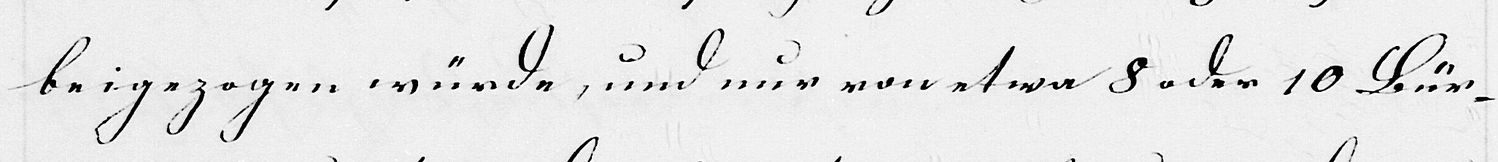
beigezogen würde, und nur von etwa 8 oder 10 Bür¬
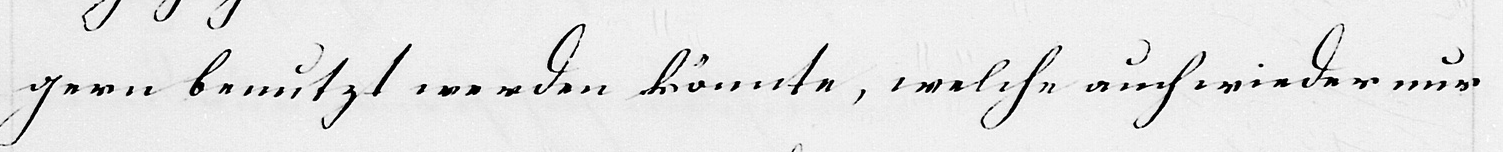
gern benutzt werden könnte, welche auch wieder nur
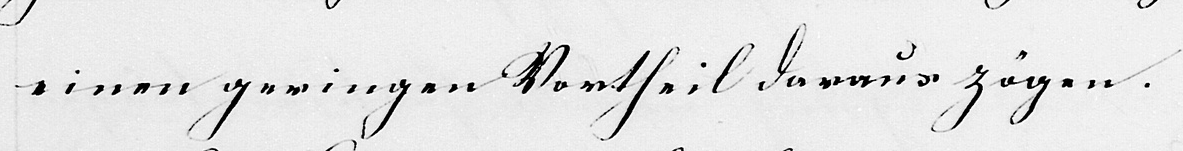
einen geringen Vortheil daraus zögen.
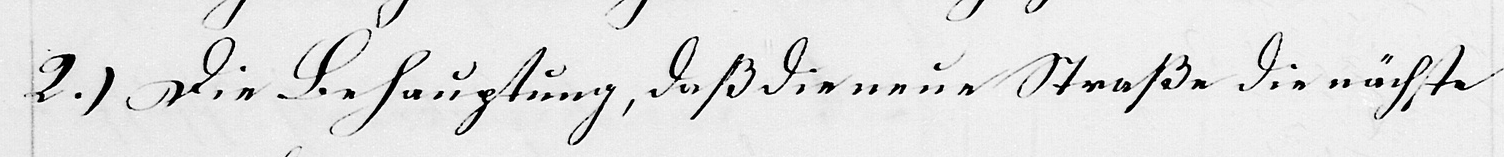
2.) Die Behauptung , daß die neue Straße die nächste
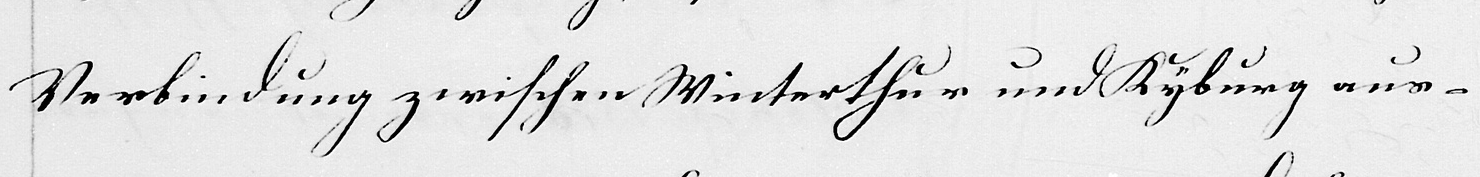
Verbindung zwischen Winterthur und Kyburg aus¬
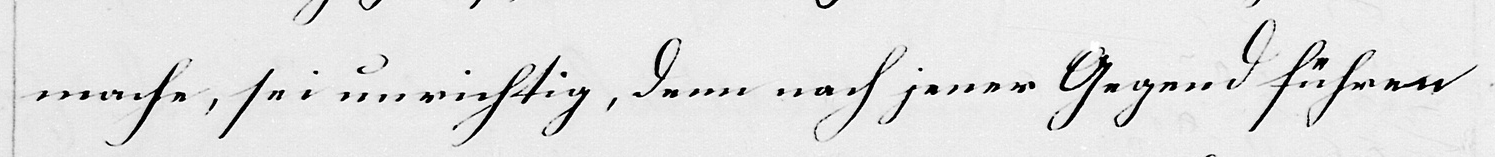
mache, sei unrichtig, denn nach jener Gegend führen
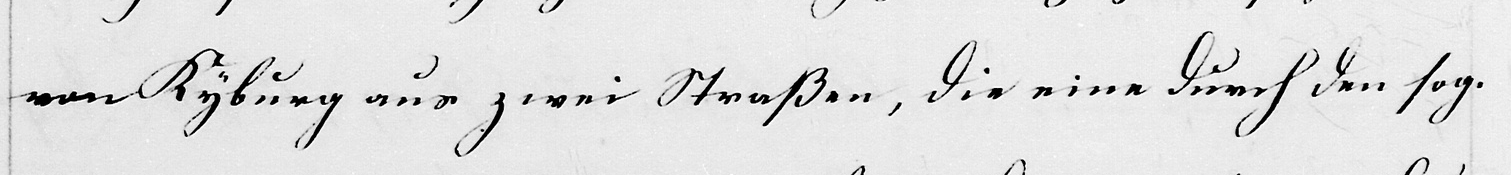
von Kyburg aus zwei Straßen, die eine durch den sog.
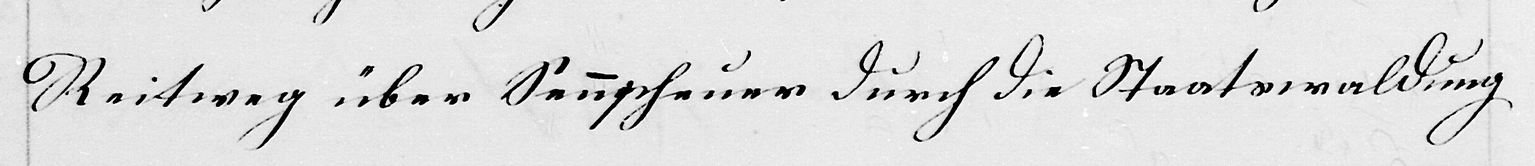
Reitweg über Sennscheuer durch die Staatswaldung
